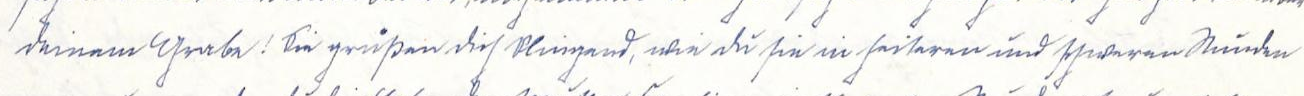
deinem Grabe! Sie grüßen dich klingend, wie du sie in heiteren und schweren Stunden
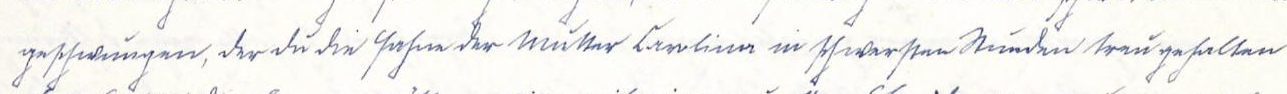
geschwungen, der du die Fahne der Mutter Carolina in schwersten Stunden treu gehalten
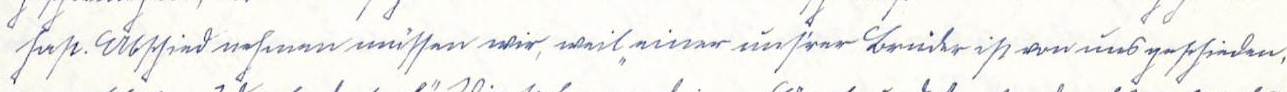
hast. Abschied nehmen müssen wir, weil einer unser Brüder ist von uns geschieden
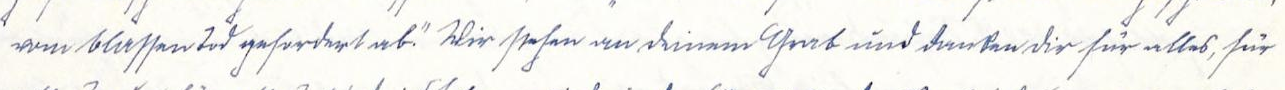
vom blassen Tod gefordert ab. Wir stehen an deinem Grab und danken Dir für alles, für
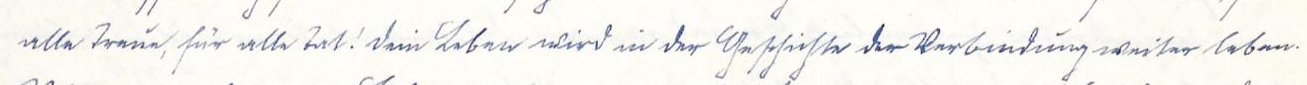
alle Treue, für alle Tat! Dein Leben wird in der Geschichte der Verbindung weiter leben.
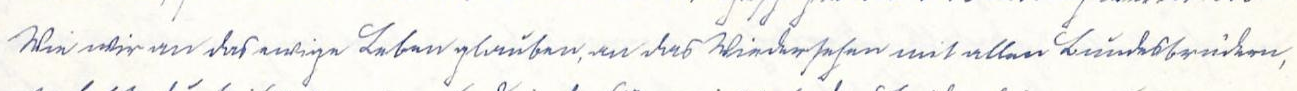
Wie wir an das ewige Leben glaube, an das Wiedersehen mit allen Bundesbrüdern,
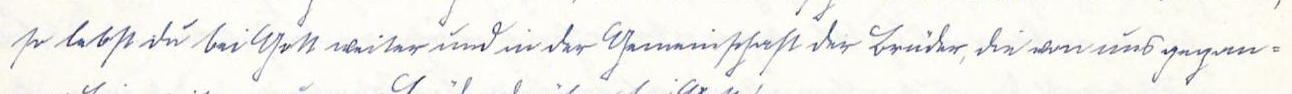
so lebst du bei Gott weiter und in der Gemeinschaft der Brüder, die von uns gegan-
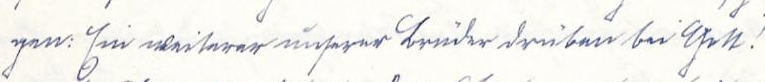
gen. Ein weiterer unserer Brüder drüben bei Gott!
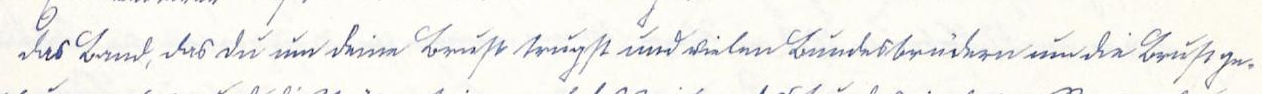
Das Band, das du um deine Brust trugst und vielen Bundesbrüdern um die Bruft ge-
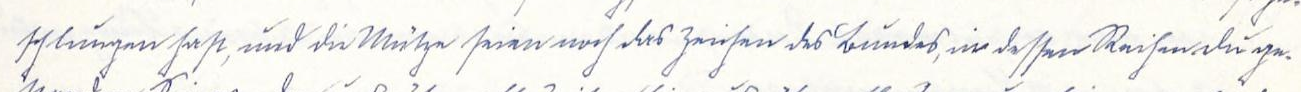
schlungen hast, und die Mütze seien noch das Zeichen des Bundes, in dessen Reihen du ge-
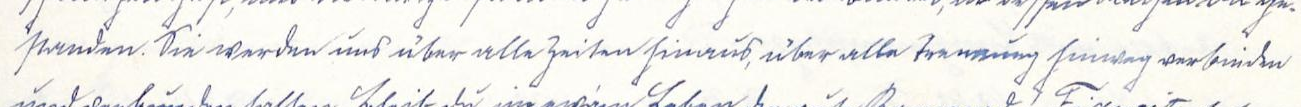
standen. Sie werden uns über alle Zeiten hinaus, über alle Trennung hinweg verbinden
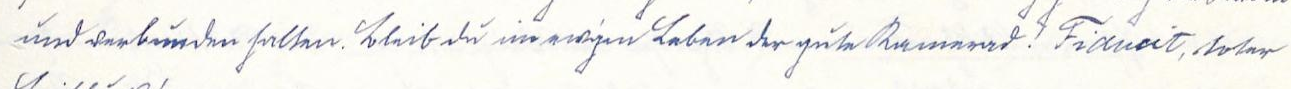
und verbunden halten. Bleib du im ewigen Leben der gute Kamerad! Fiducit, toter
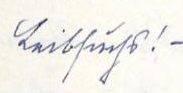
Leibfuchs!
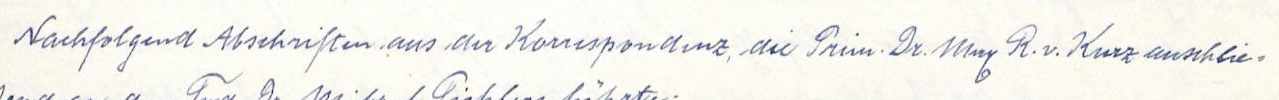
Nachfolgend Abschriften aus der Korrespondenz, die Prim. Dr. Max R. v. Kurz anschlie-
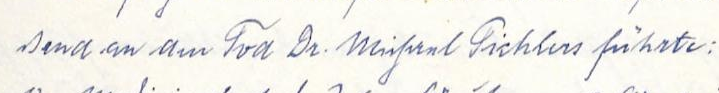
ßend an den Tod Dr. Michael Pichlers führte:
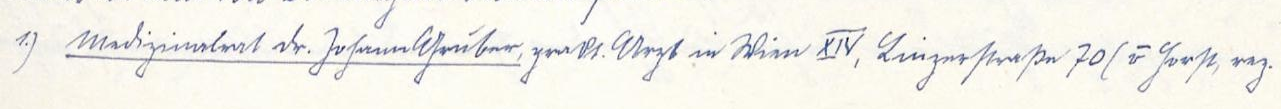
1). Medizinalrat Dr. Johann Gruber, prakt. Arzt in Wien XIV, Linzerstraße 70(v/o Horst, rez
